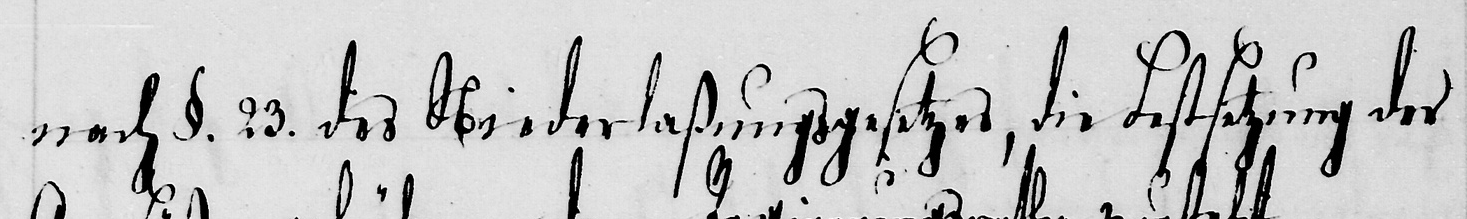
nach §. 23 des Niederlaßungsgesetzes, die
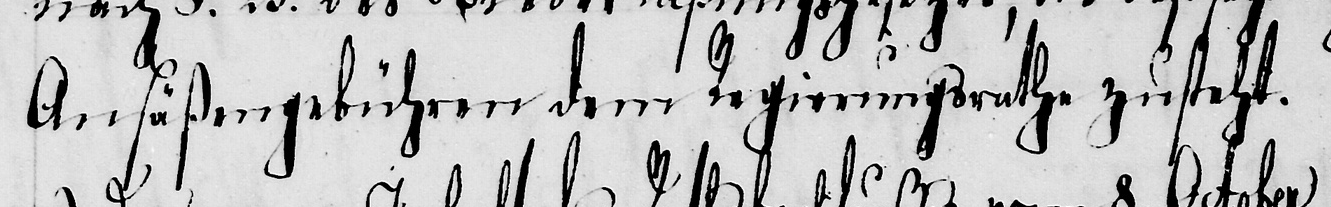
Ansäßengebühren dem Regierungsrathe zusteht.
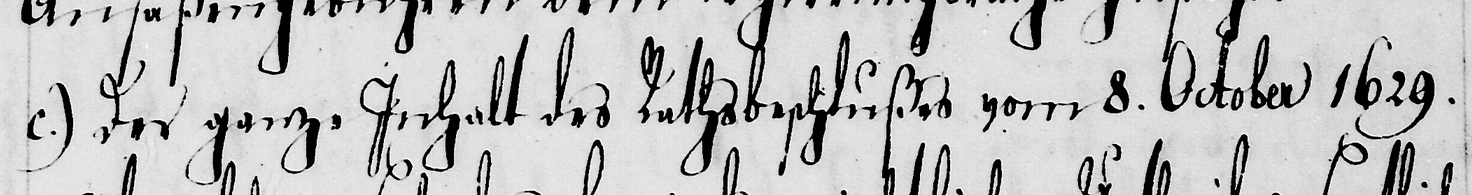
c.) Der ganze Inhalt des Rathsbeschlußes vom 8. October 1629.
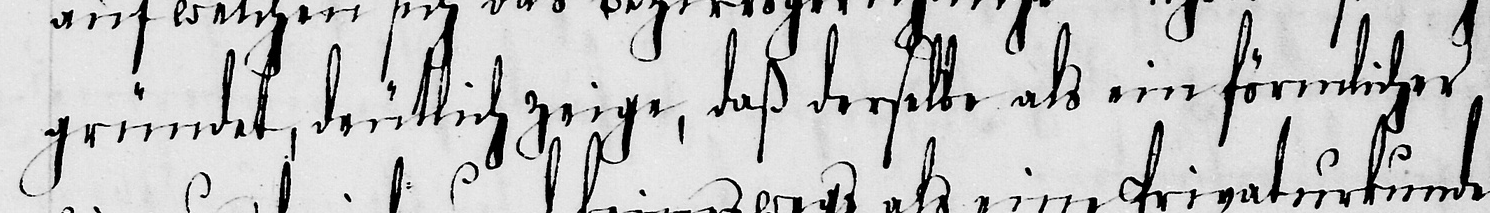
gründet, deutlich zeige, daß derselbe als ein förmlicher
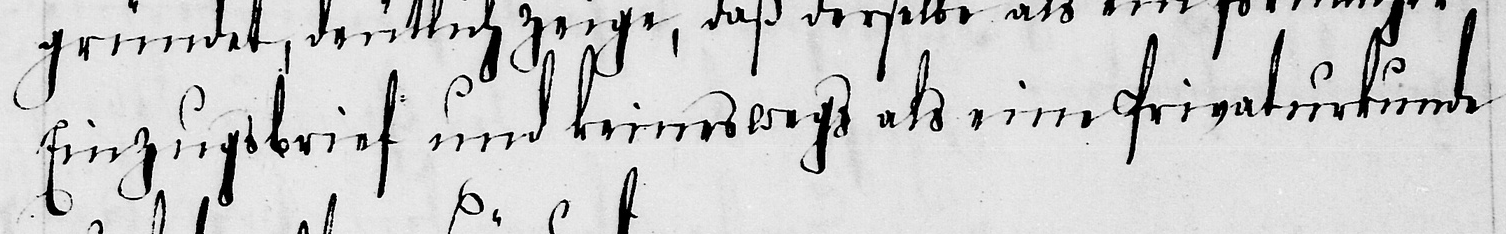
Einzugsbrief und keineswegs als eine Privaturkunde
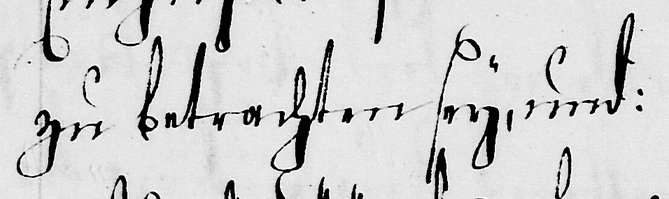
zu betrachten sey, und:
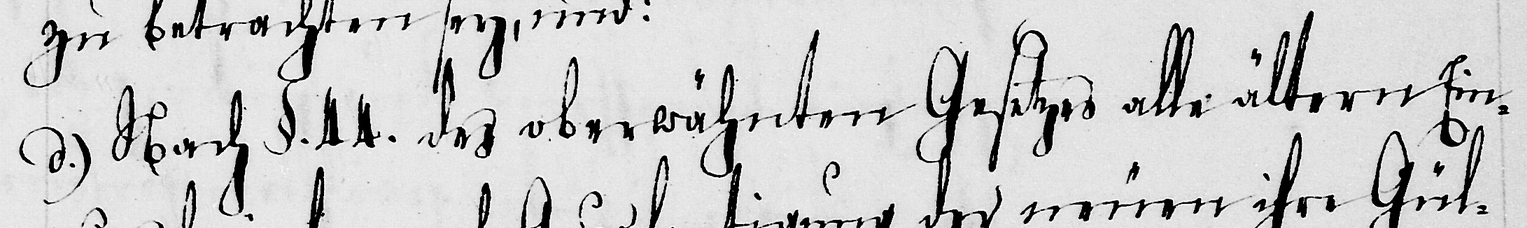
d.) Nach §. 44. des oberwähnten Gesetzes alle ältern Ein¬
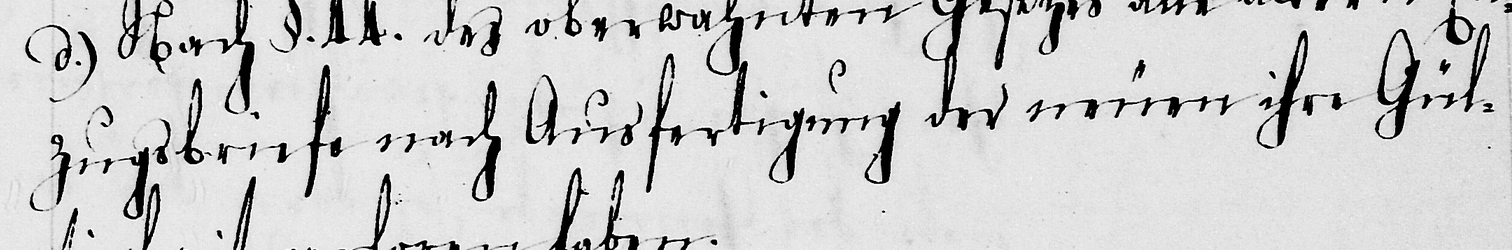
zugsbriefe nach Ausfertigung der neuen ihre Gül¬
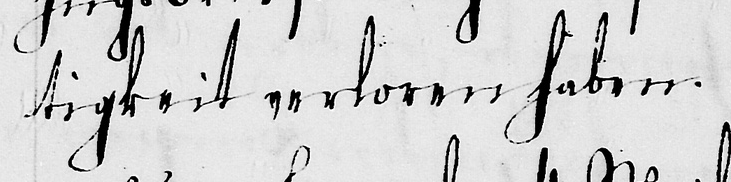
tigkeit verloren haben.
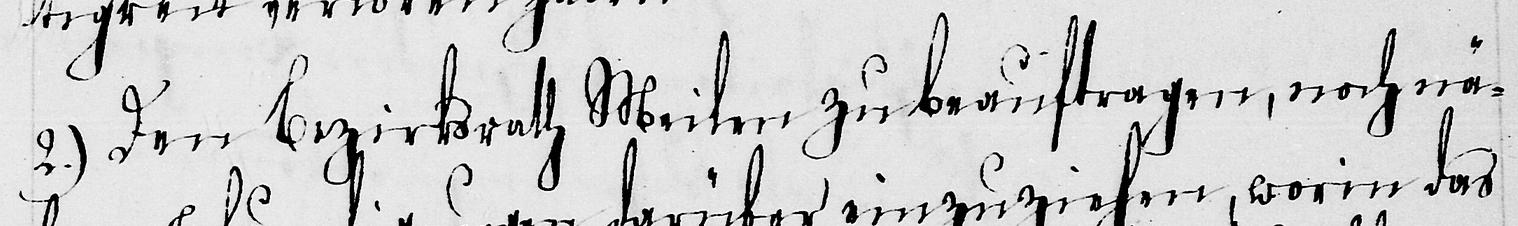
2.) Den Bezirksrath Meilen zu beauftragen, noch nä¬
